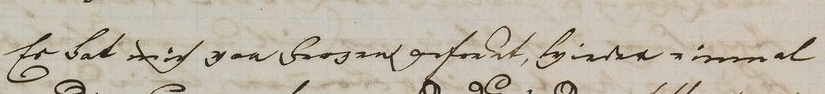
Es hat mich von Herzen gefreut, wieder einmal
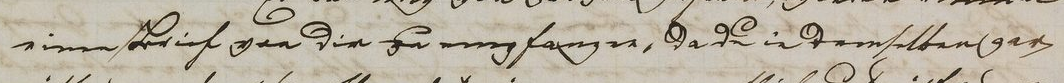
einen Brief von Dir zu empfangen, da Du in demselben gar
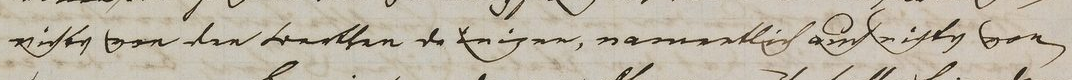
nichts von den werthen Deinigen, namentlich auch nichts von
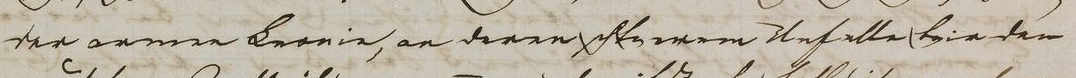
der armen Leonie, an deren schwerem Unfalle wir den
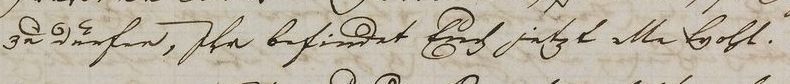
zu dürfen, Ihr befindet Euch jetzt alle wohl.
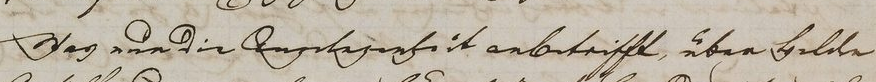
Was nun die Angelegenheit anbetrifft, über welche
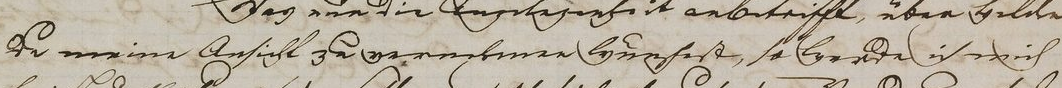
Du meine Ansicht zu vernehmen wünschest, so werde ich mich
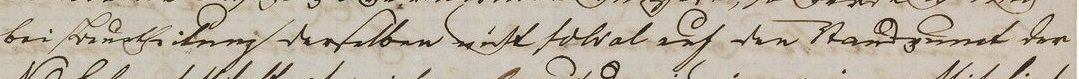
bei Beurtheilung derselben nicht sowol auf den Standpunct der
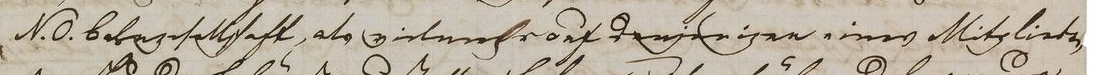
N.O.Bahngesellschaft, als vielmehr auf denjenigen eines Mitgliedes
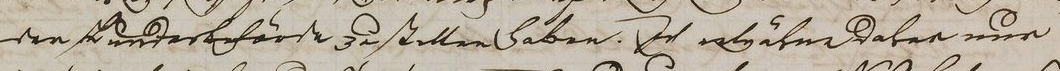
der Bundesbehörde zu stellen haben. Ich erwähne daher nur
